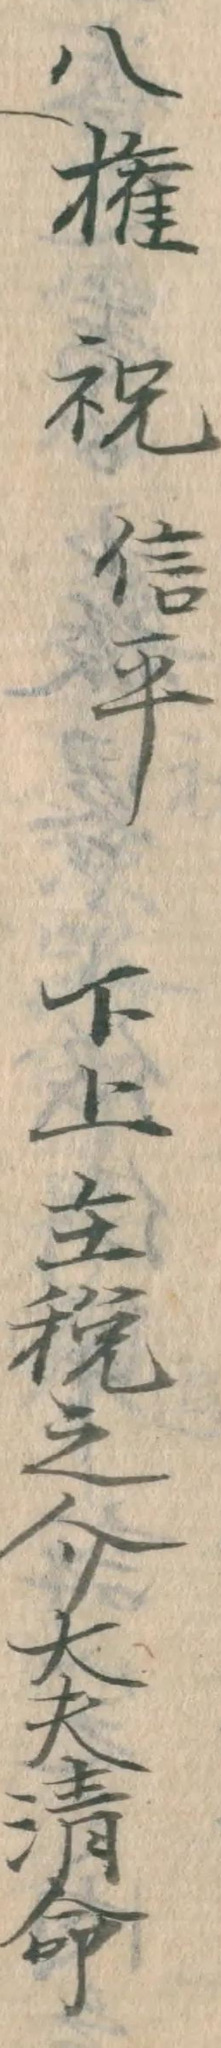八権祝信平下上主税之介大夫清命
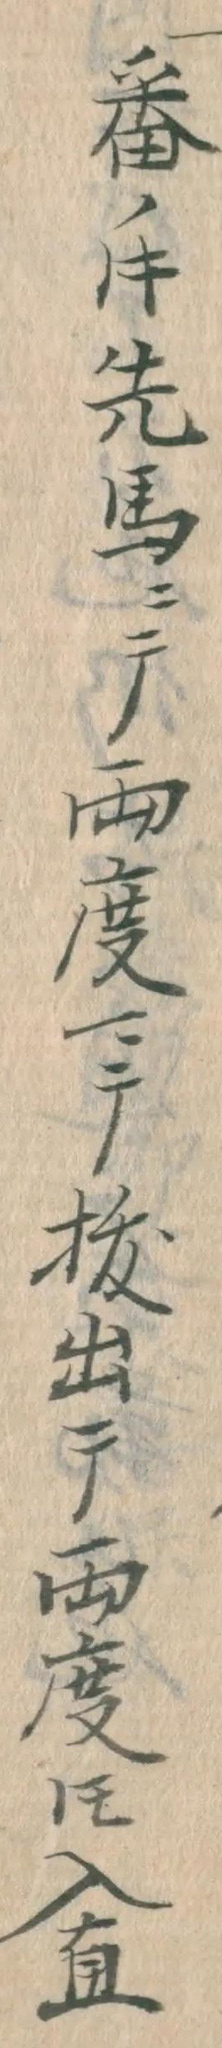(番ノトキ先馬ニテ両度マテ抜出テ両度トモ入直
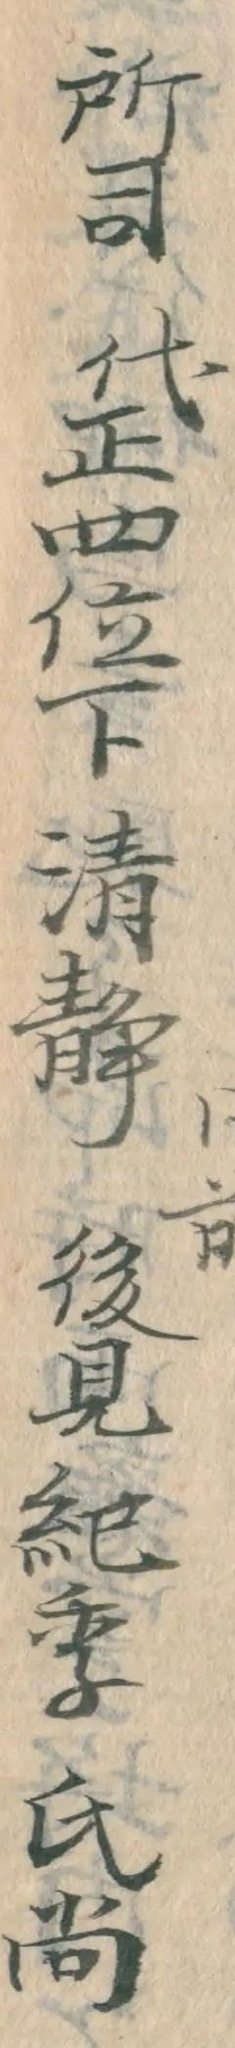所司代正四位下清静後見紀季氏尚

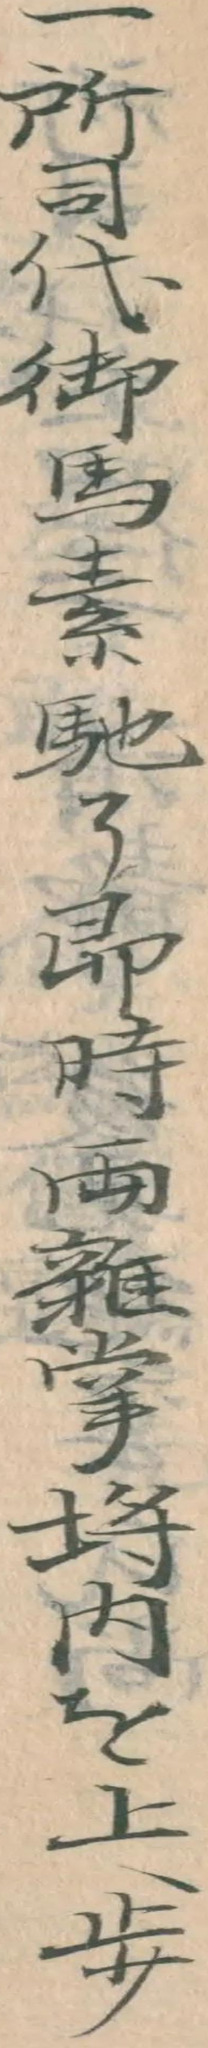一所司代御馬素馳了即時両雑掌埒内を上へ歩
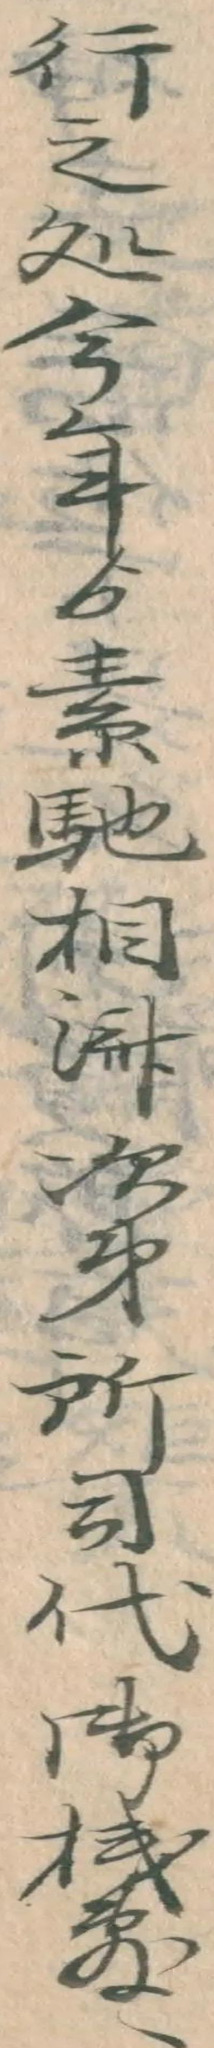行之処今年ゟ素馳相済次第所司代御桟敷へ
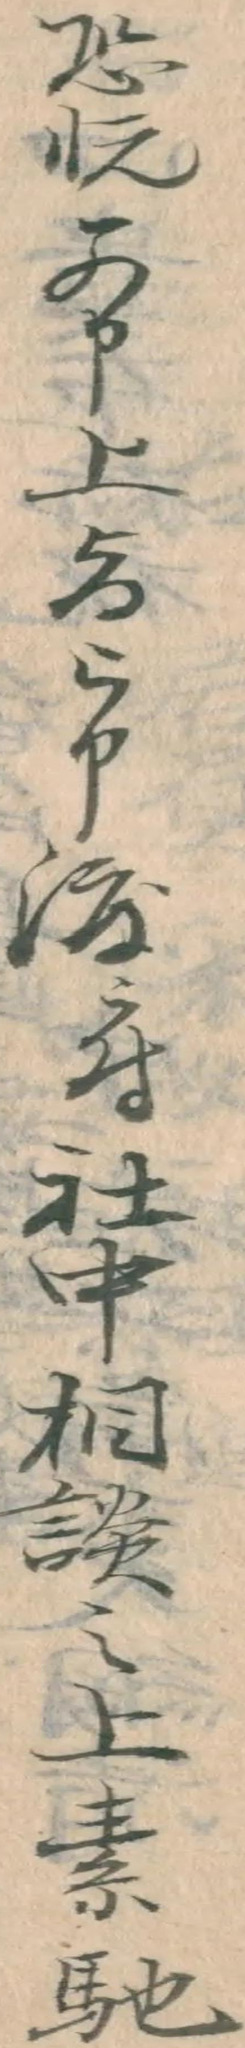恐悦可申上旨被申渡ニ付社中相談之上素馳
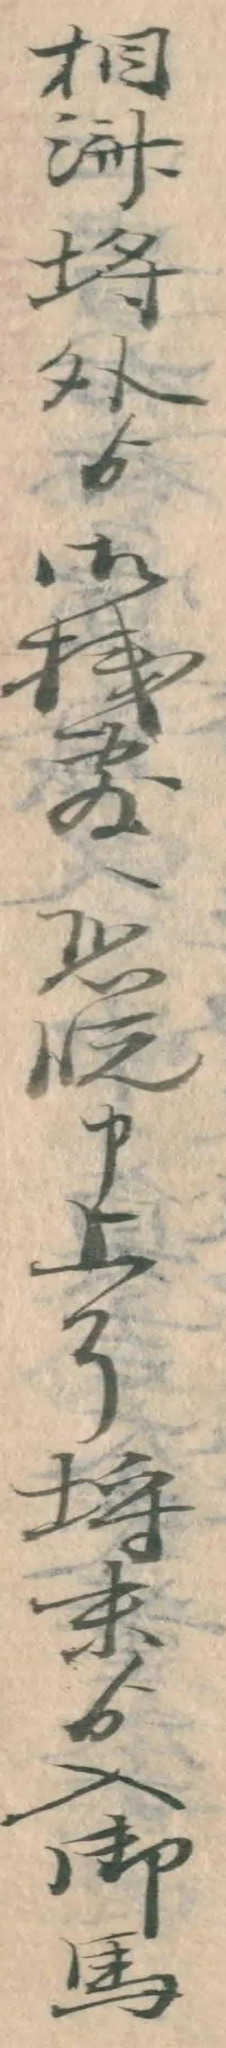相済埒外ゟ御桟敷へ恐悦申上了埒末ゟ入御馬
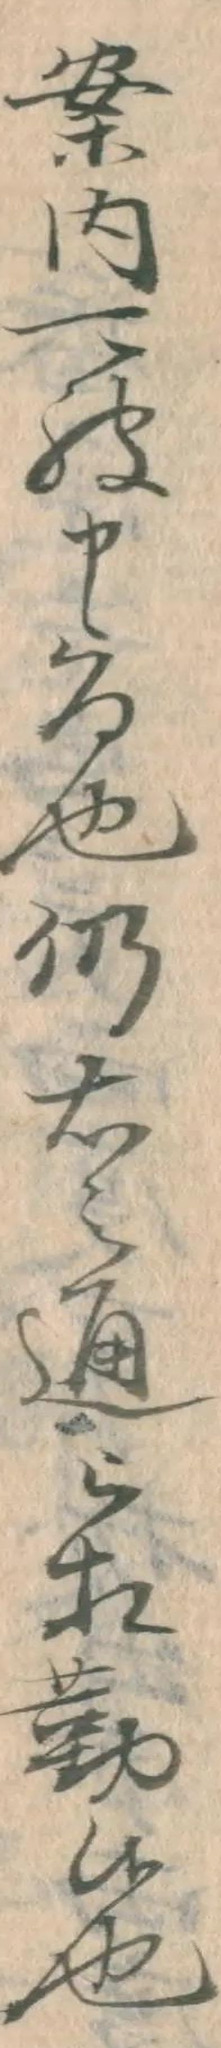案内可致申旨也仍右之通被相勤候也
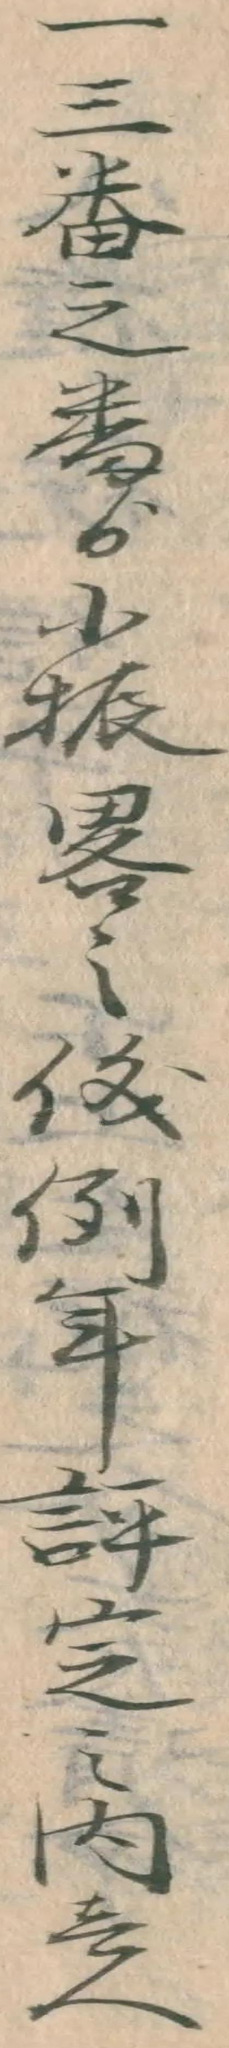一三番之番ゟ小振略之儀例年評定之内壱人
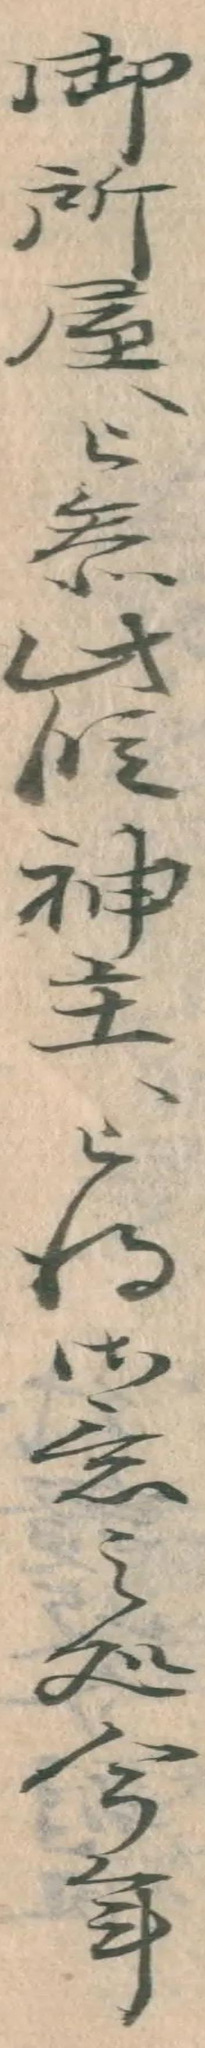御所屋へ被参此段神主へ被得御意之処今年
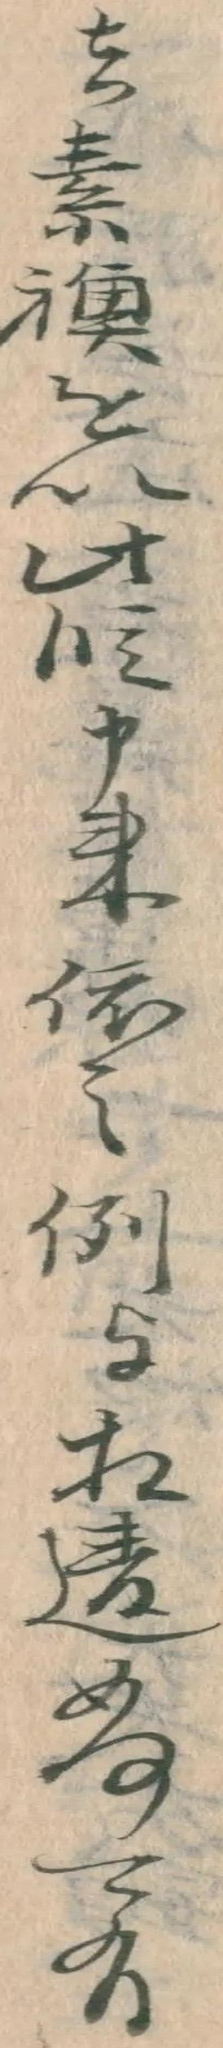者素襖を以此段申来依之例与例与相違如何可有
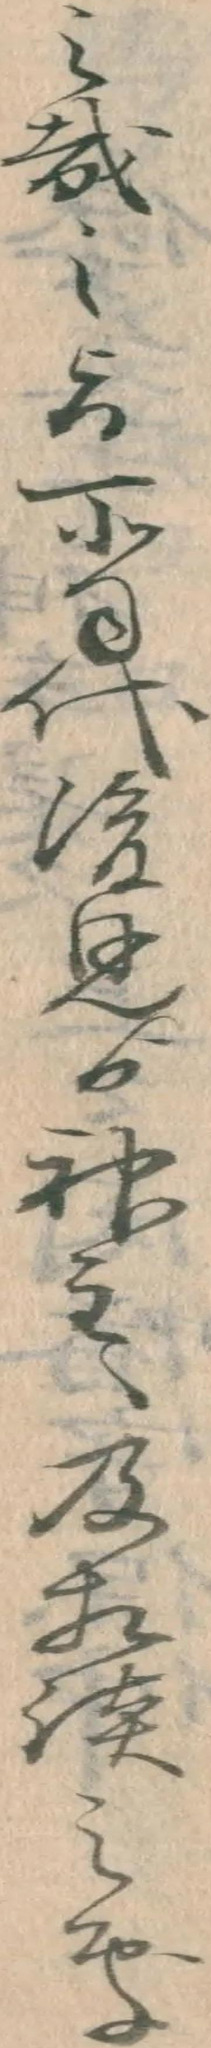之哉之旨所司代後見ゟ神主へ及相談之処
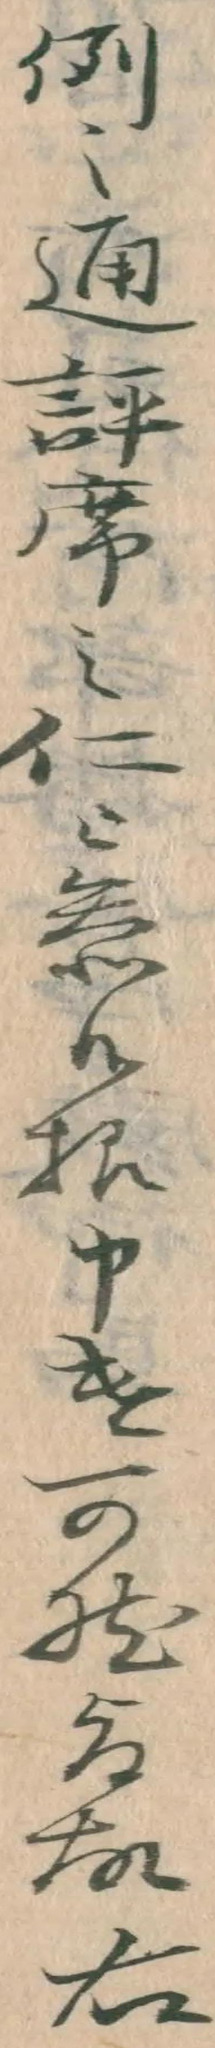例之通評席之仁被参候様申遣可然旨故右
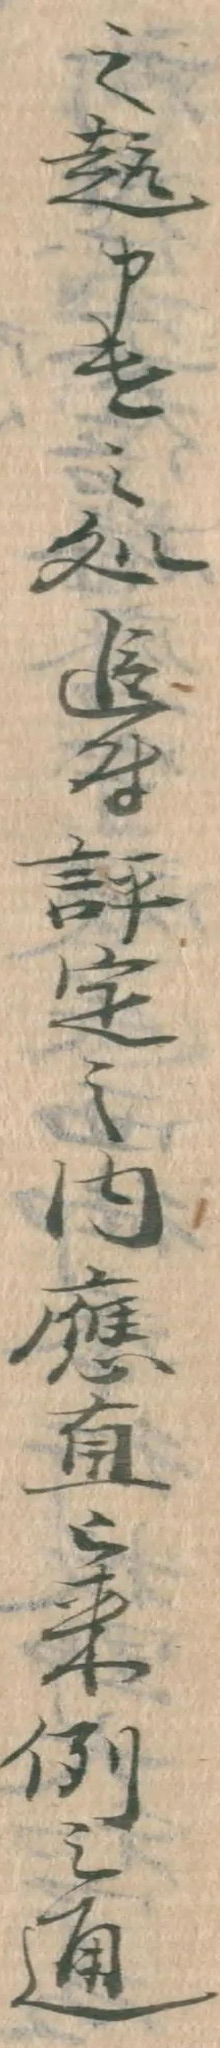之趣申遣之処追付評定之内応直被来例之通
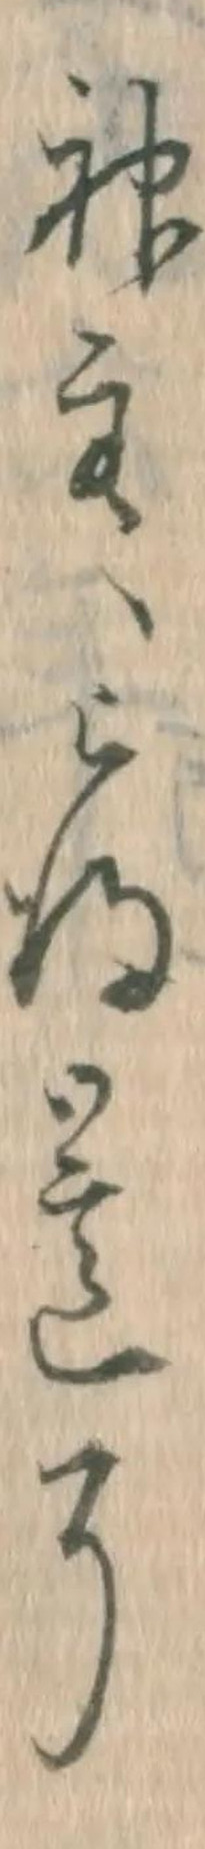神主へ被得御意了
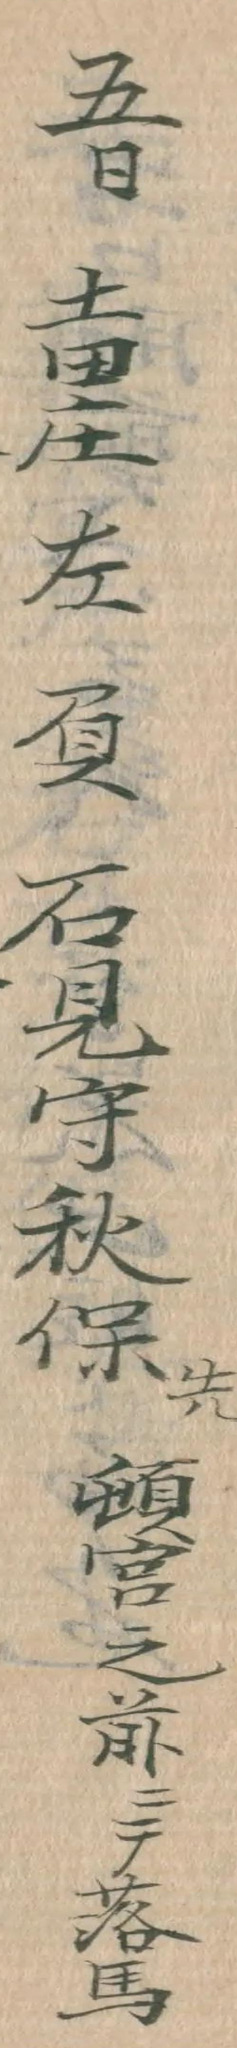五日土田庄左負石見守秋保先順宮之前ニテ落馬
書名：賀茂社記録. 第10冊
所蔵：国立国会図書館 National Diet Library, JAPAN
